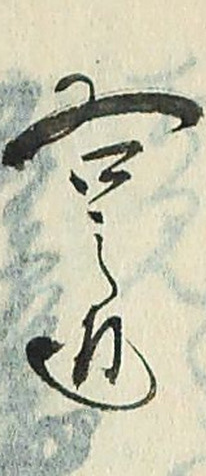右之通
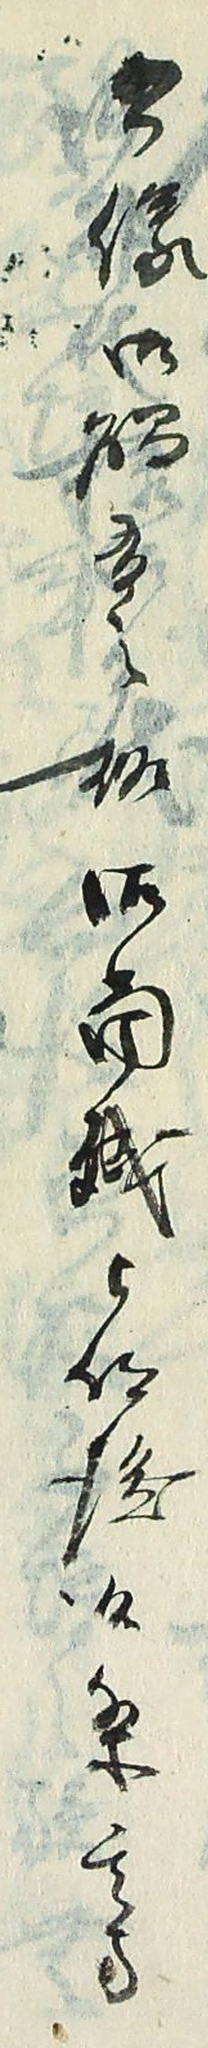公儀御触有之趣御当職被仰渡候条其方
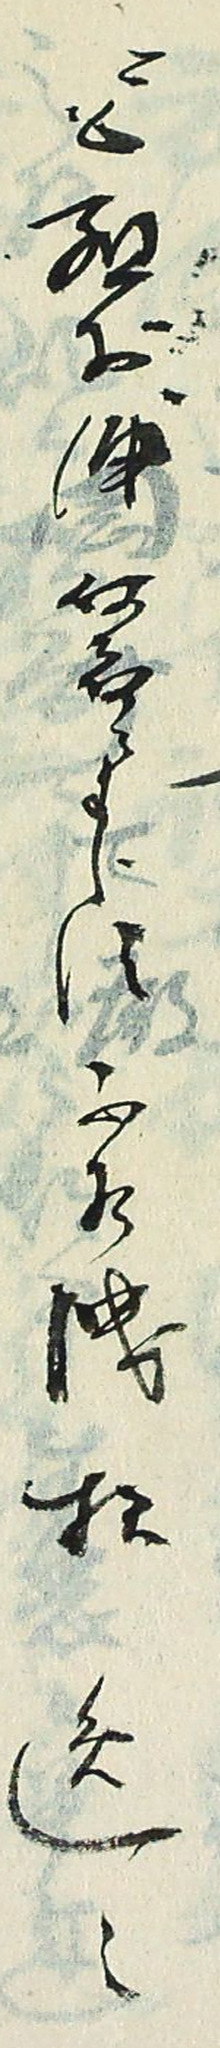とも組村浦何者によらす不相洩様逸々
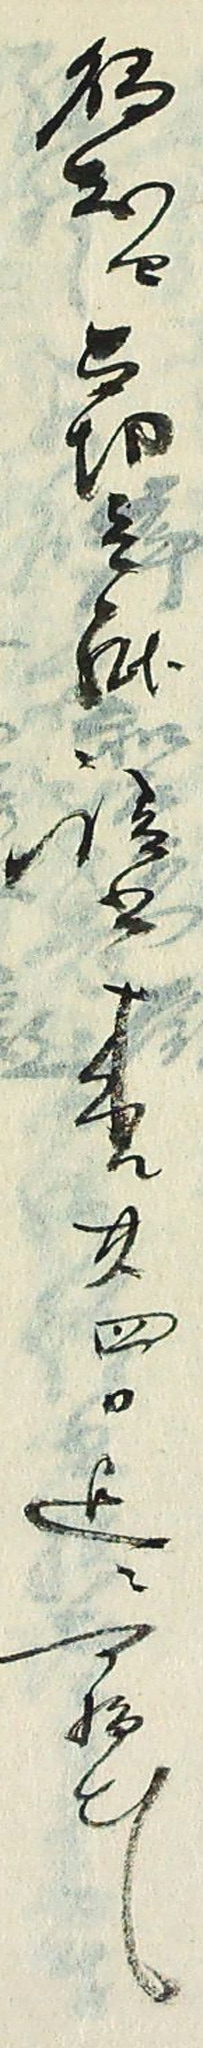触知せ与切壱紙請書来る廿四日迄に可指出候
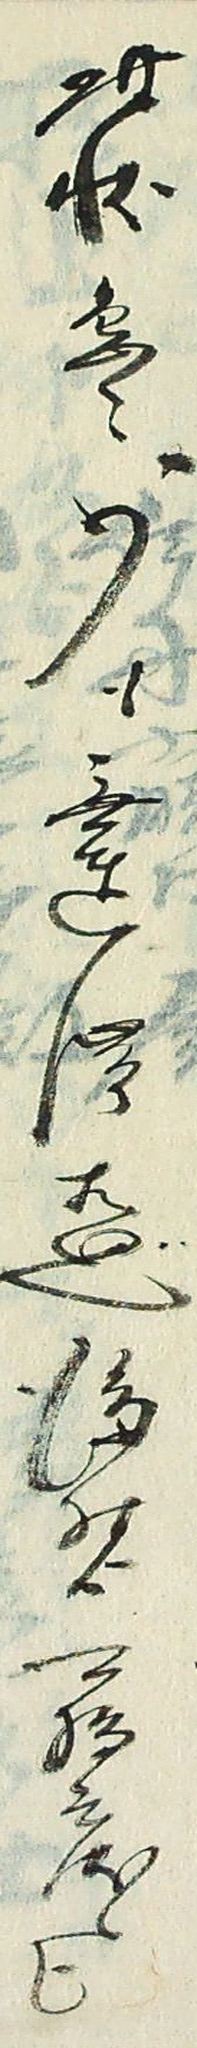此状急々少も無遅滞相廻済村ゟ可指戻候以上
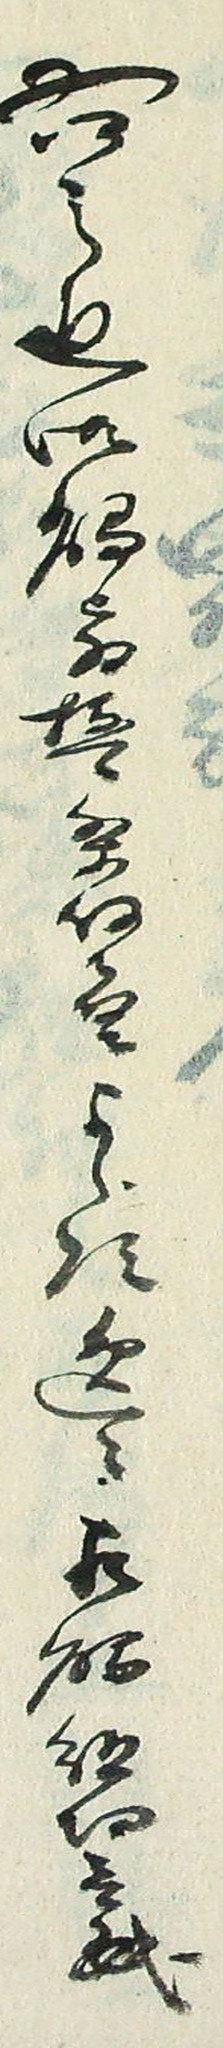右之通御触被為遊候条何者によらす逸々相触組切壱紙
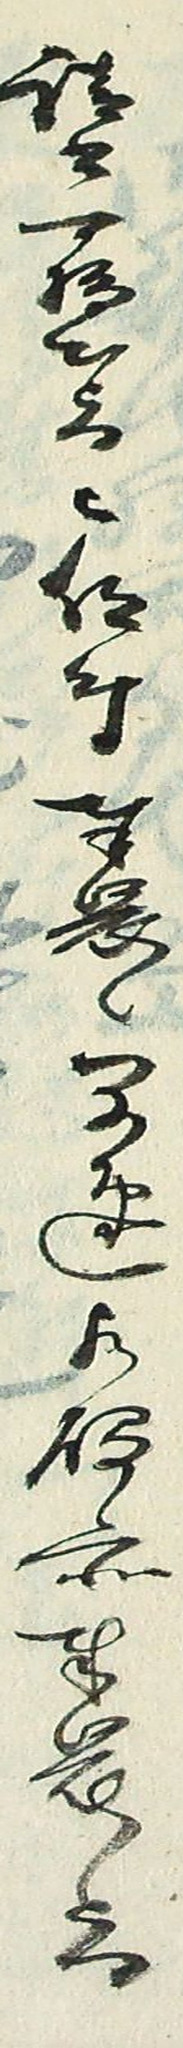請書可指出旨被仰付奉畏候早速相触候所奉畏旨
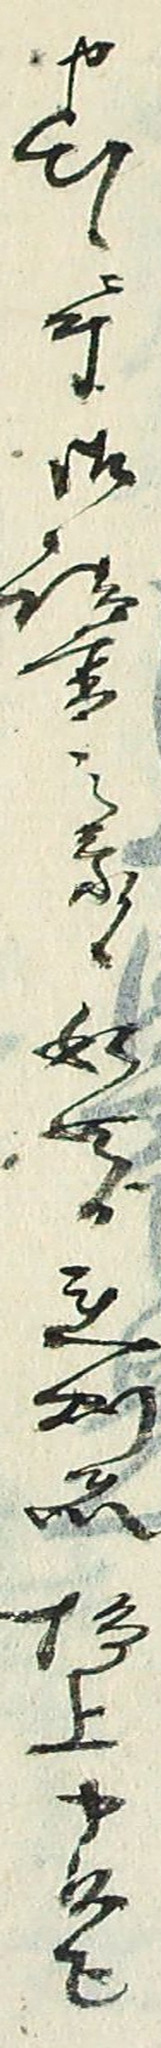申出候に付請書之義は私共ゟ連判を以指上申候以上

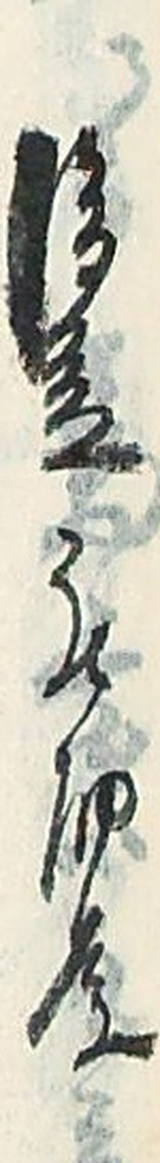後藤庄助殿
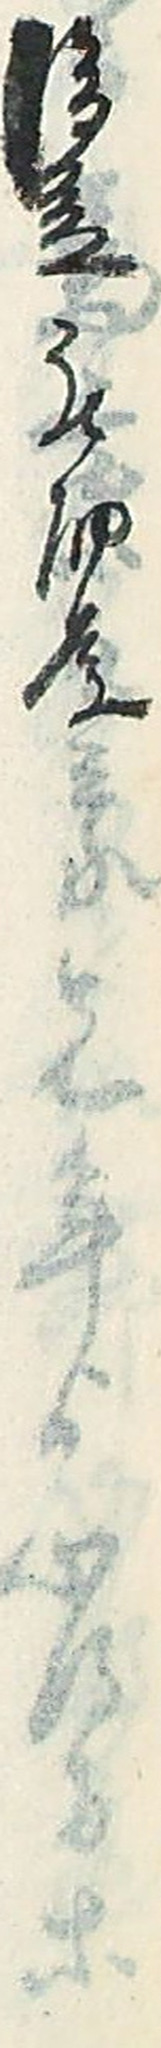後藤庄助殿
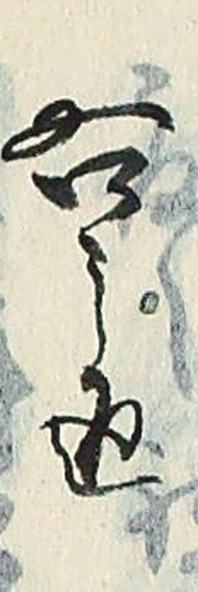右之通
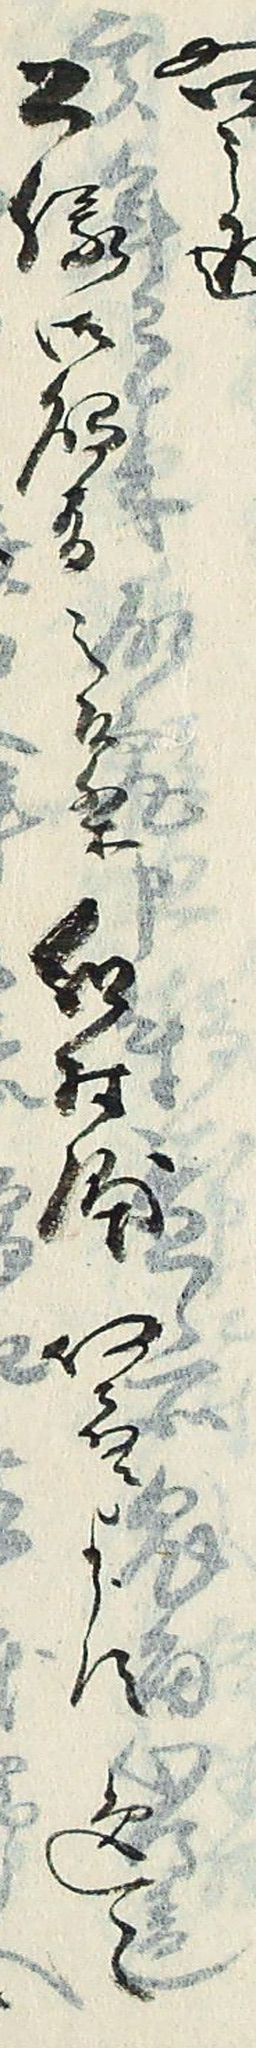公儀御触有之候条組浦村何者によらす逸々
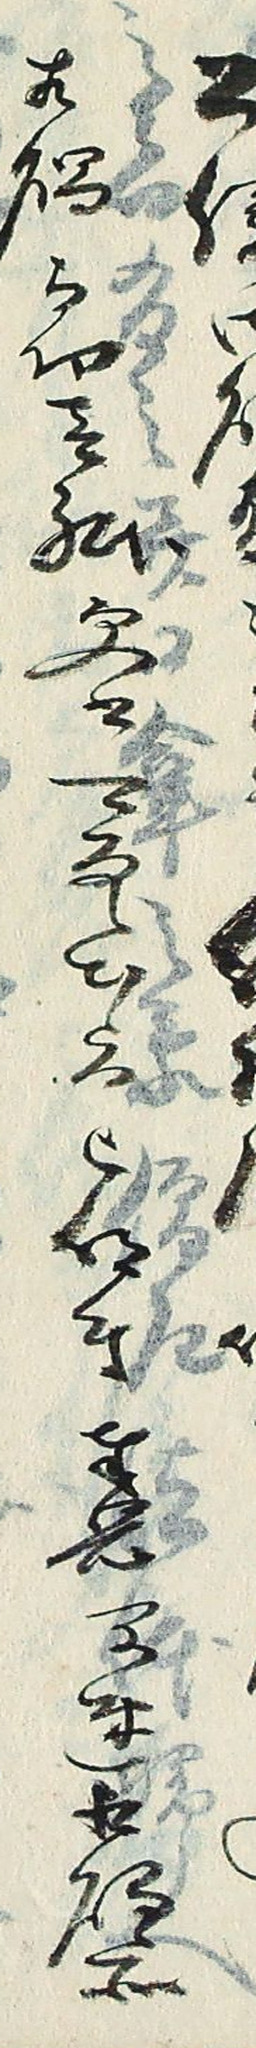相触与切壱紙受書可差出旨被仰付奉畏早速相触候所
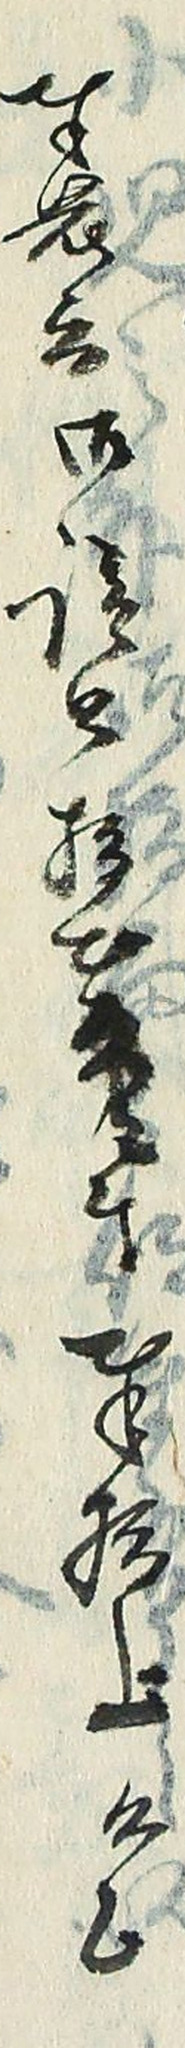奉畏旨御請書指出申候に付奉指上候以上
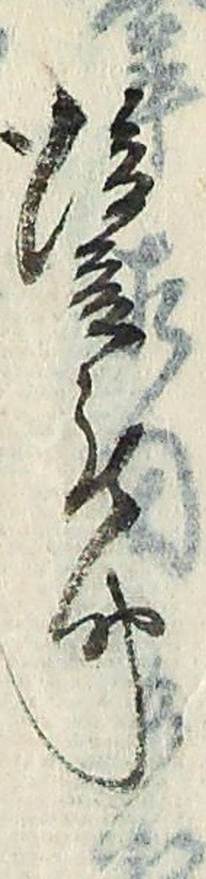後藤庄助
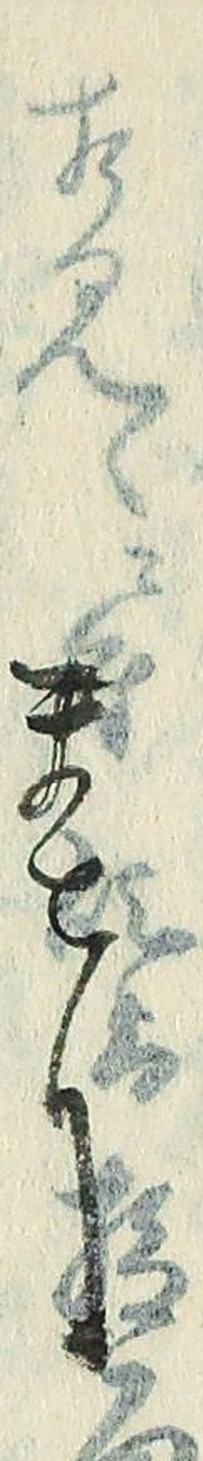未七月
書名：諸御用御□受書控
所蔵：鳴門教育大学 Naruto University of Education
